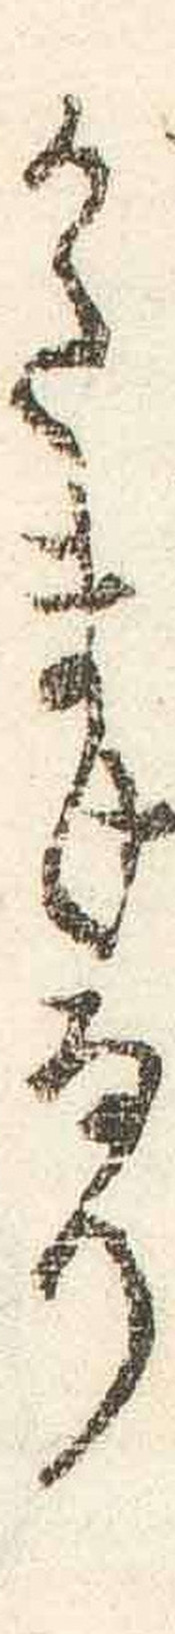かたまけなり
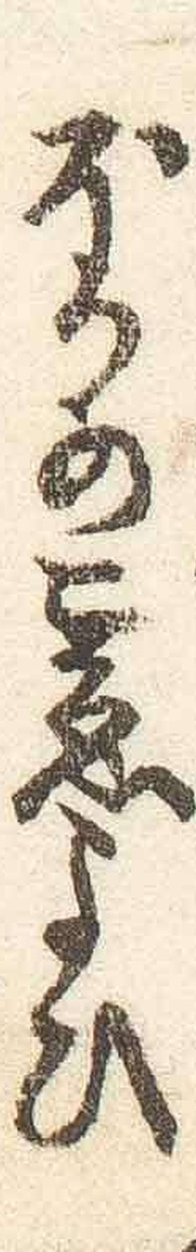ほかのこゑよひ
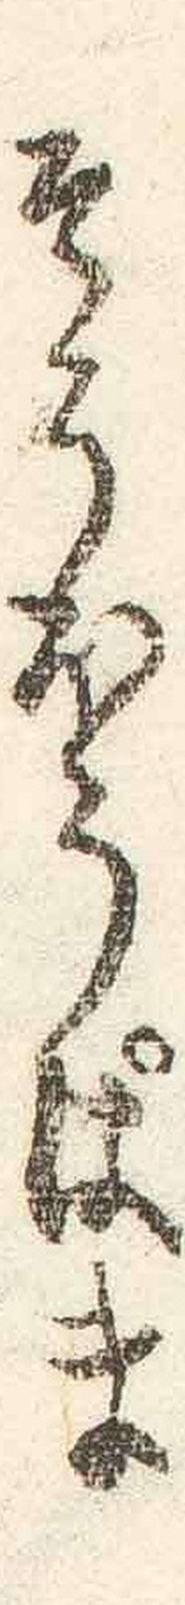そうほうぱま
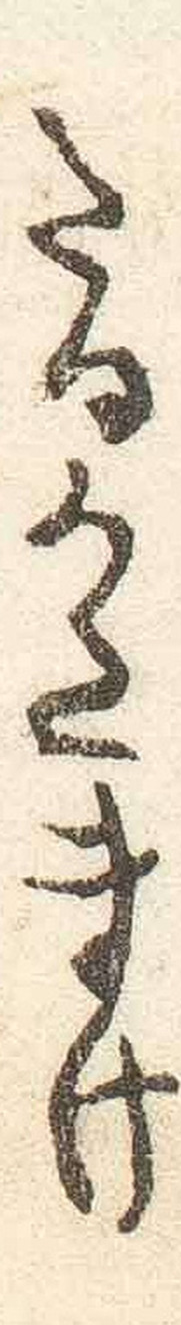たるかたまけ
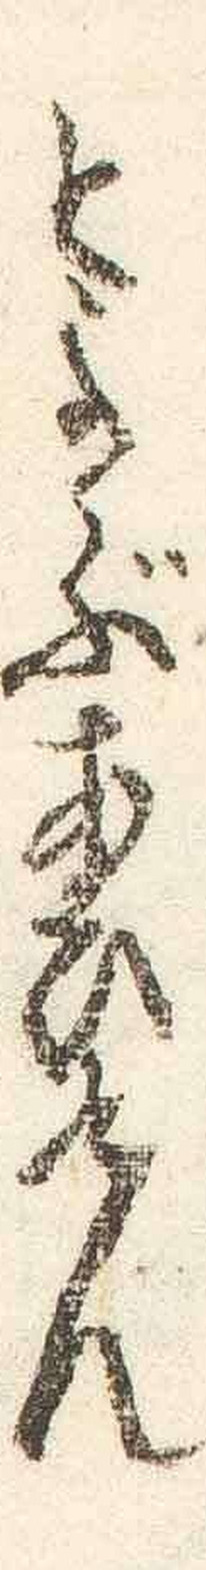とよぶあひけん
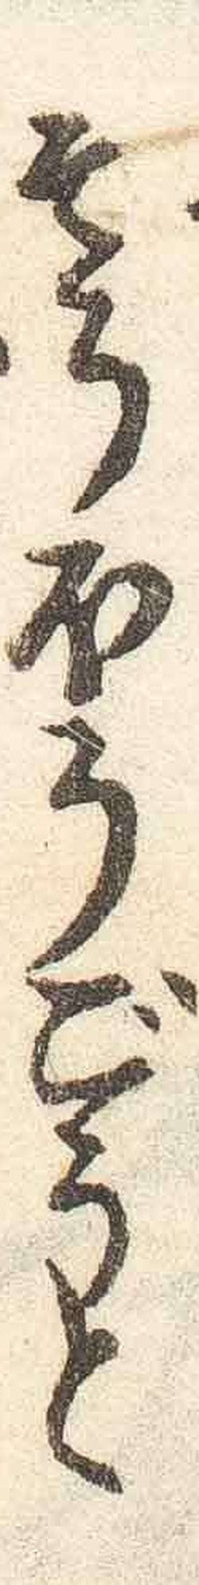そうほうごうと
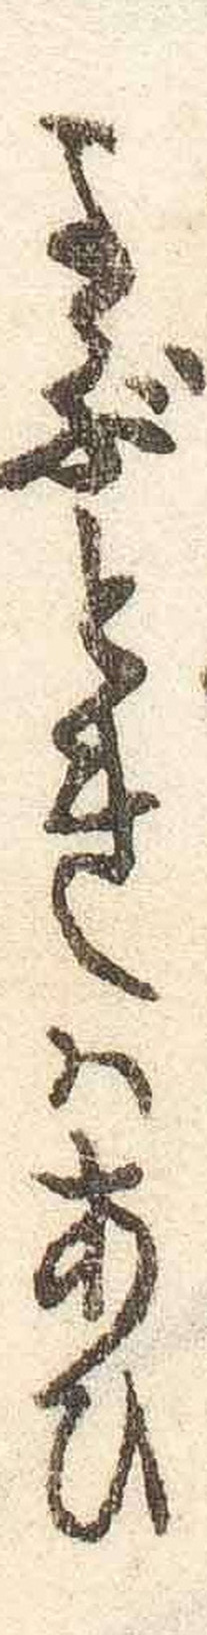よぶときはあひ
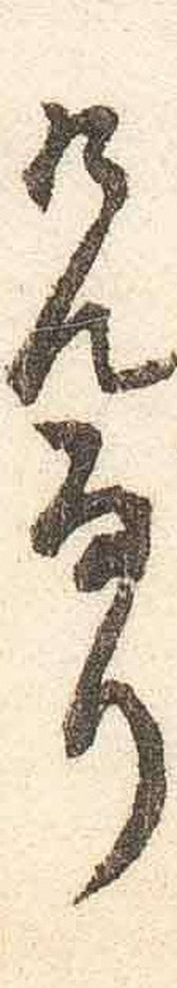けんなり
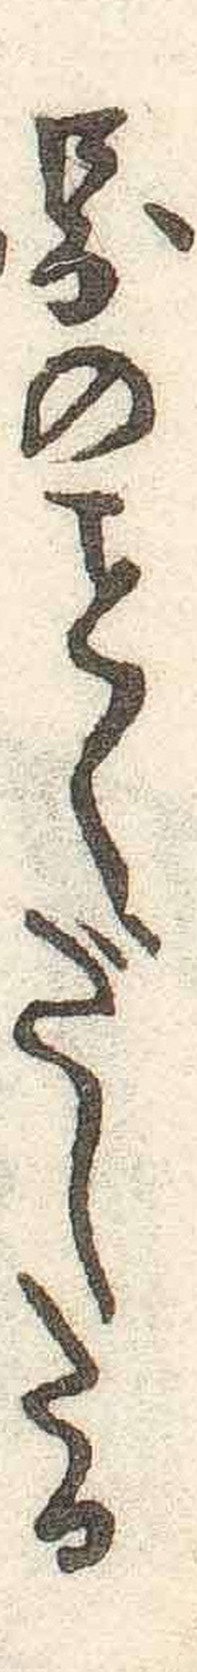図のことくだしたる
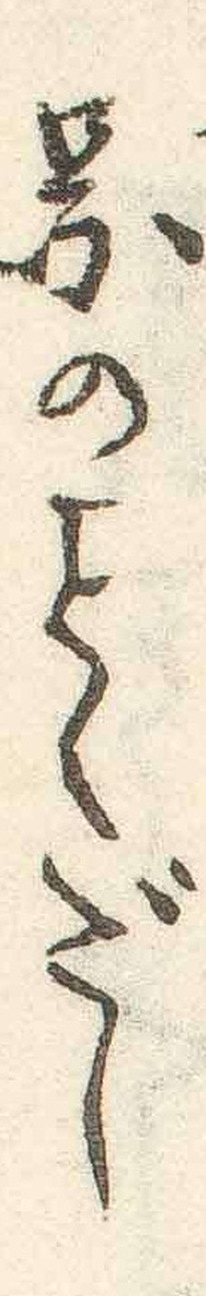図のことくだし
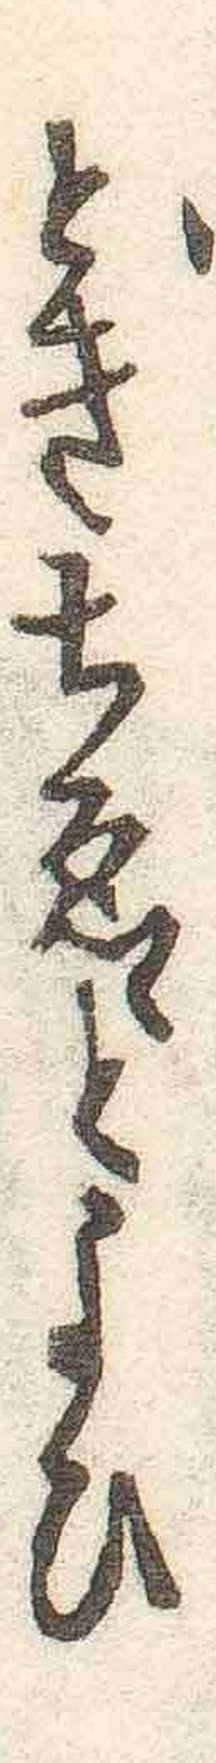ときちゑゝとよひ
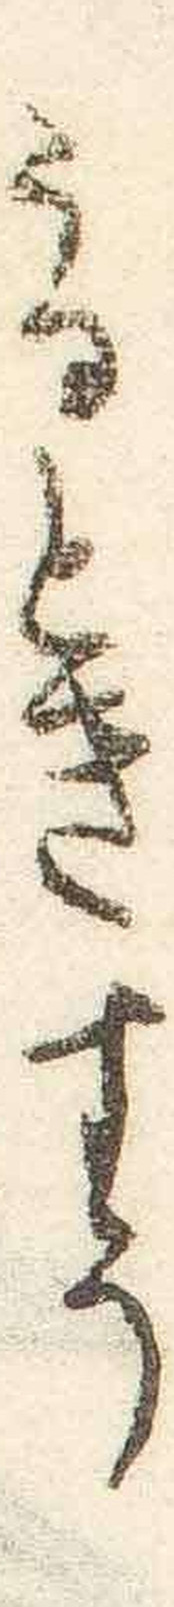たるときすう
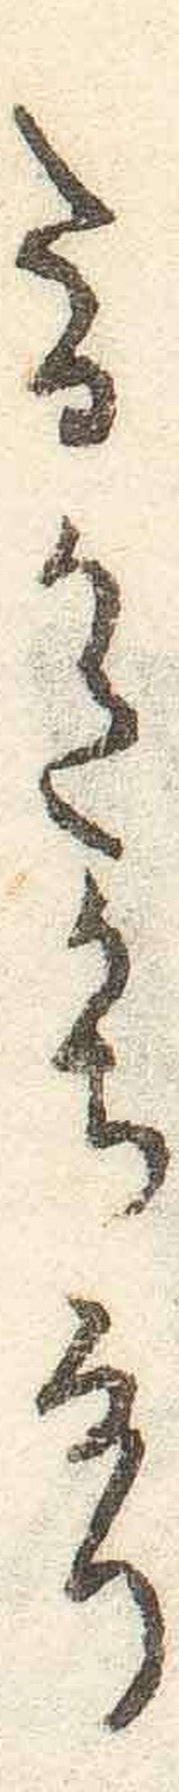たるかたかちなり
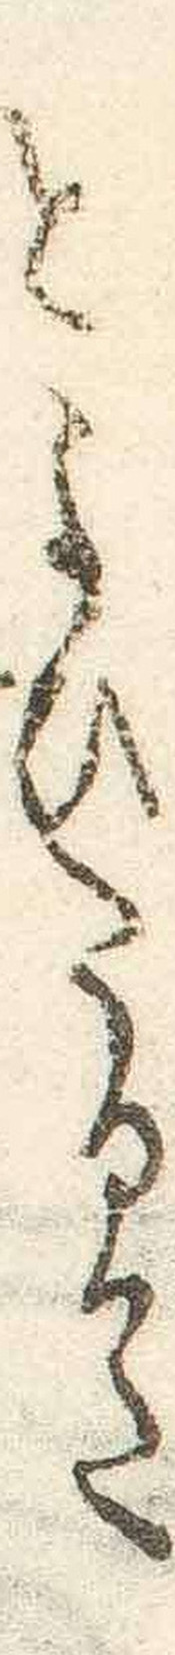とよひたるかた
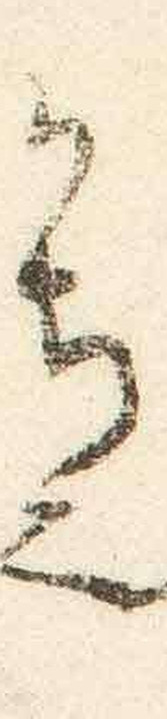かち也
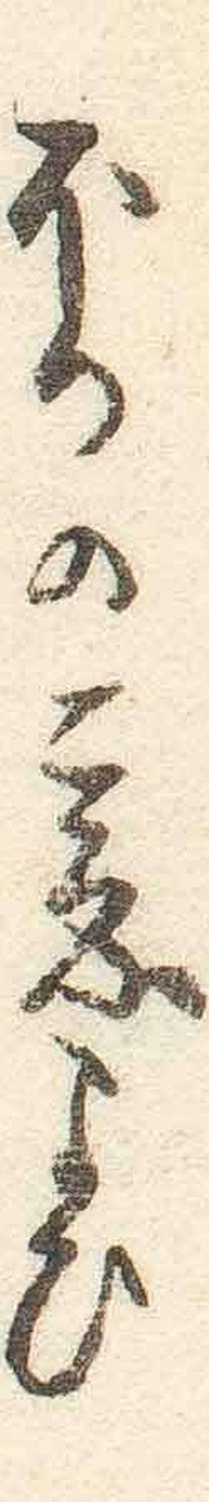ほかのこゑよひ
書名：拳独稽古
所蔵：東京学芸大学附属図書館 国文学研究資料館
